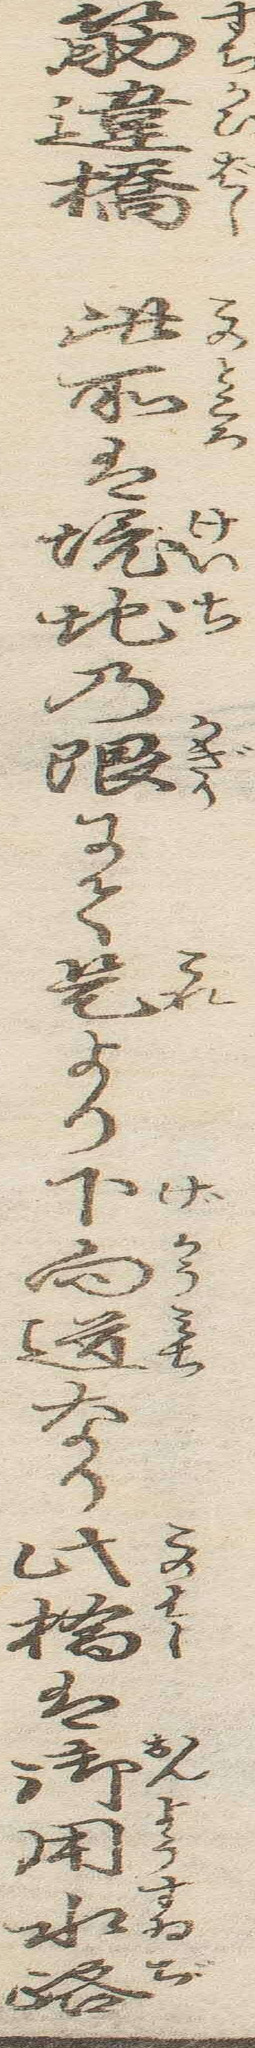筋違橋此所は境地の限にて是より下向道なり此橋は御用水路
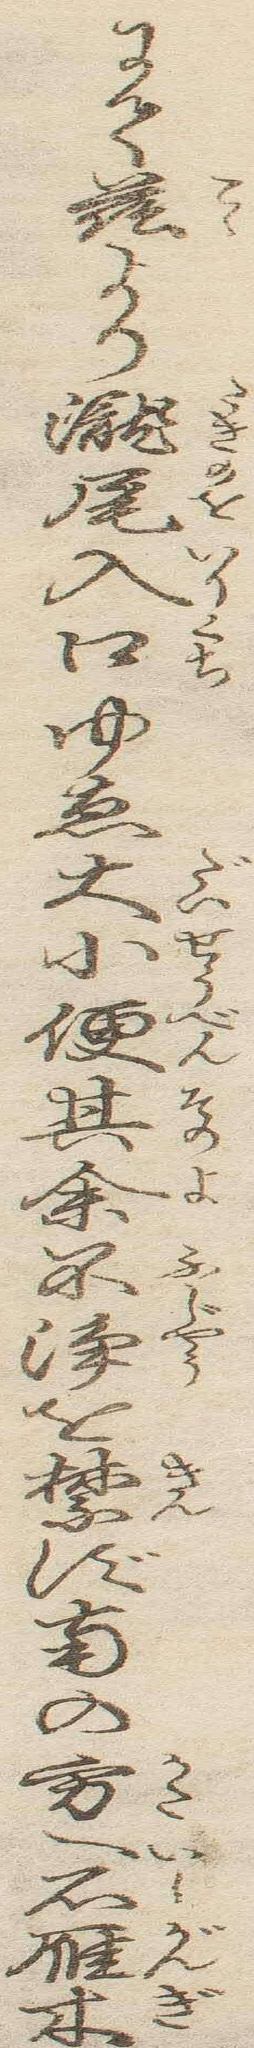にて茲より瀧尾入口ゆゑ大小便其余不浄を禁ず南の方へ石雁木
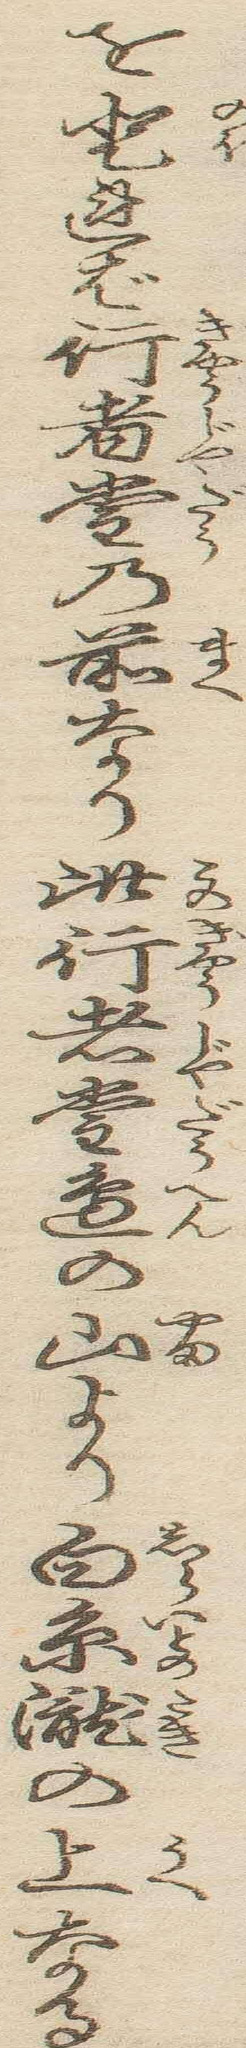を登れば行者堂の前なり此行者堂邊の山より白糸瀧の上なる

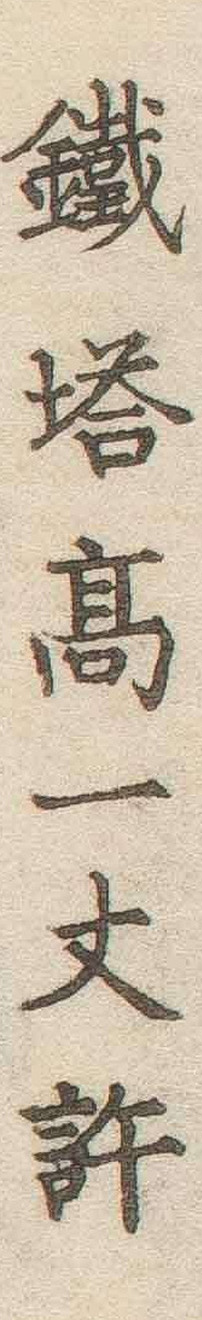鐵塔髙一丈許
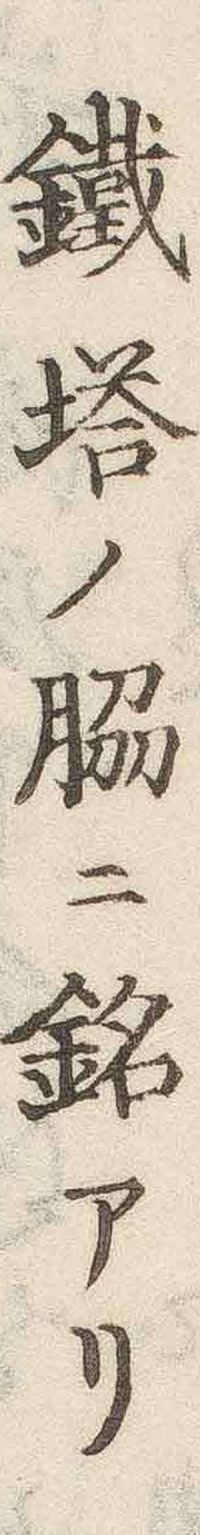鐵塔ノ脇ニ銘アリ
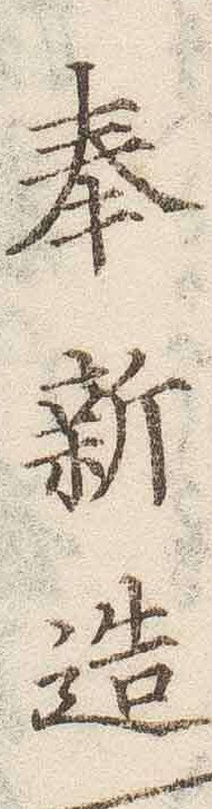奉新造
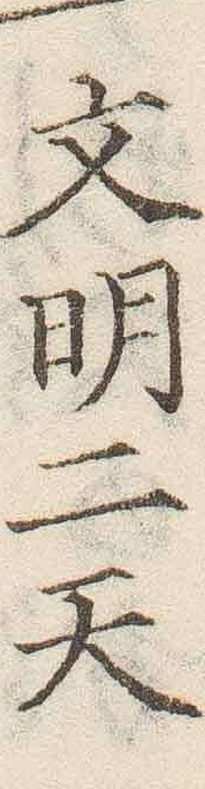文明二天
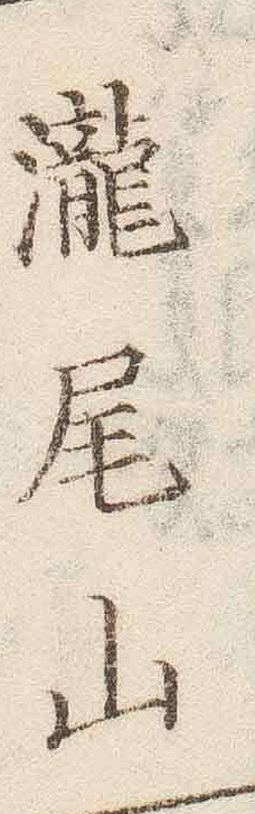瀧尾山
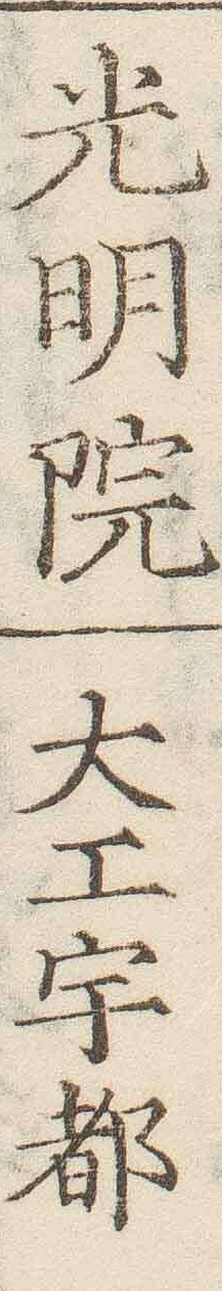光明院大工宇都
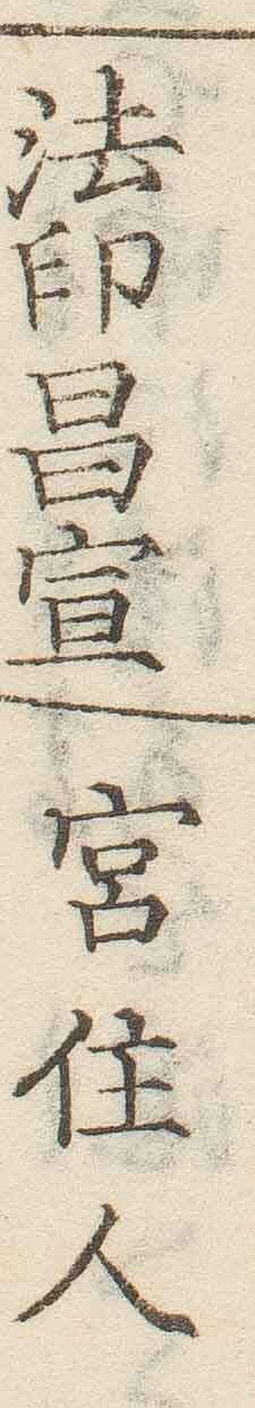法印昌宣宮住人
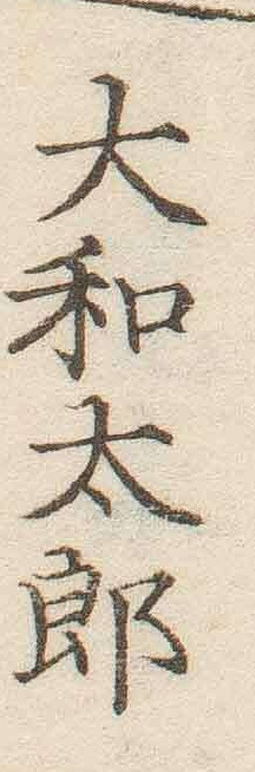大和太郎
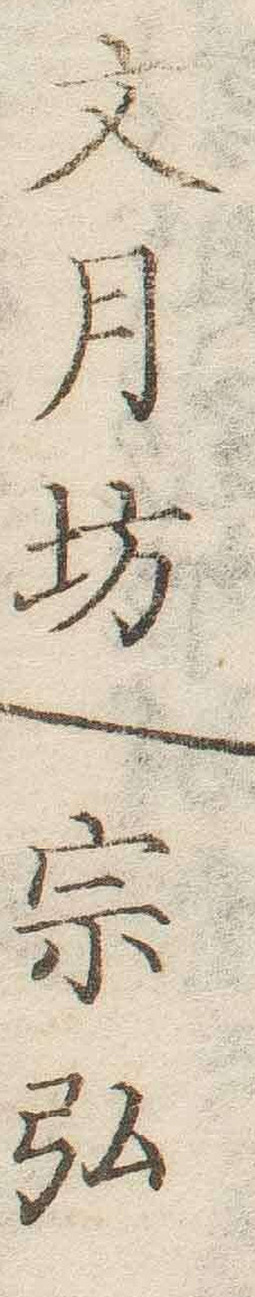文月坊宗弘

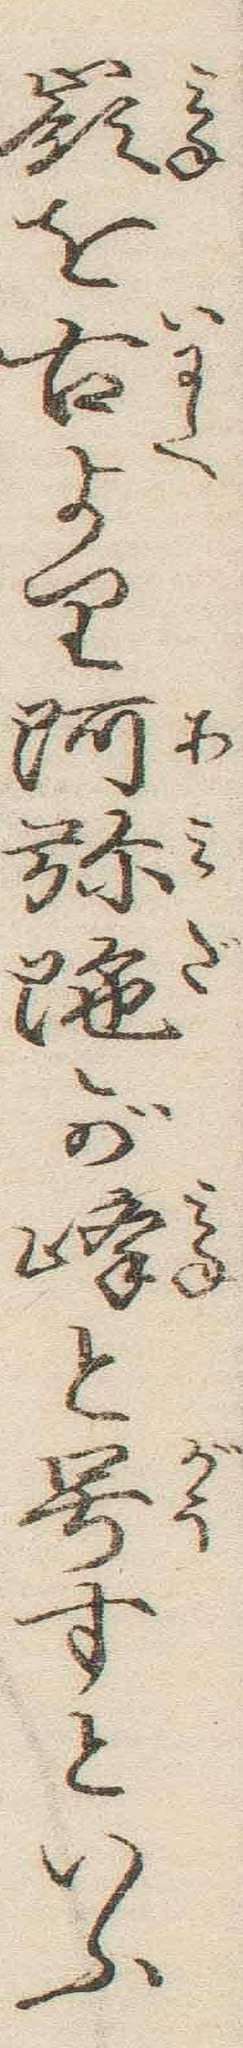嶺を古より阿弥陀が峰と号すといふ
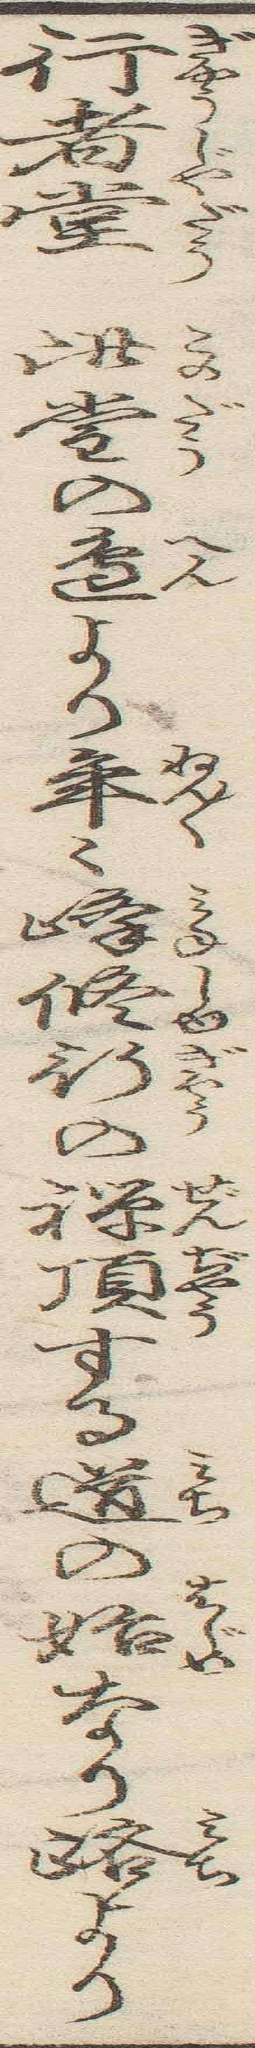行者堂此堂の邊より年〻峰修行の禅頂する道の始なり路より
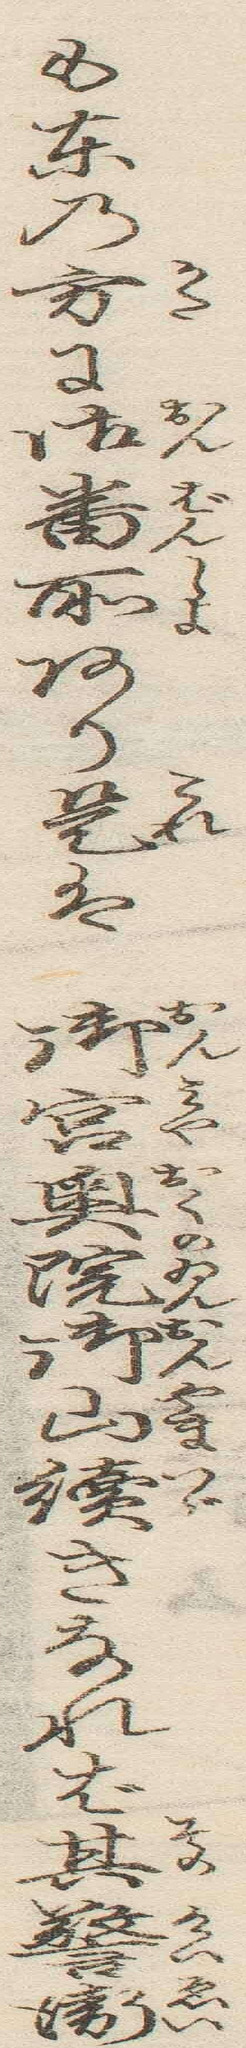も東の方に御番所あり是は御宮奥院御山續きなれば其警衞
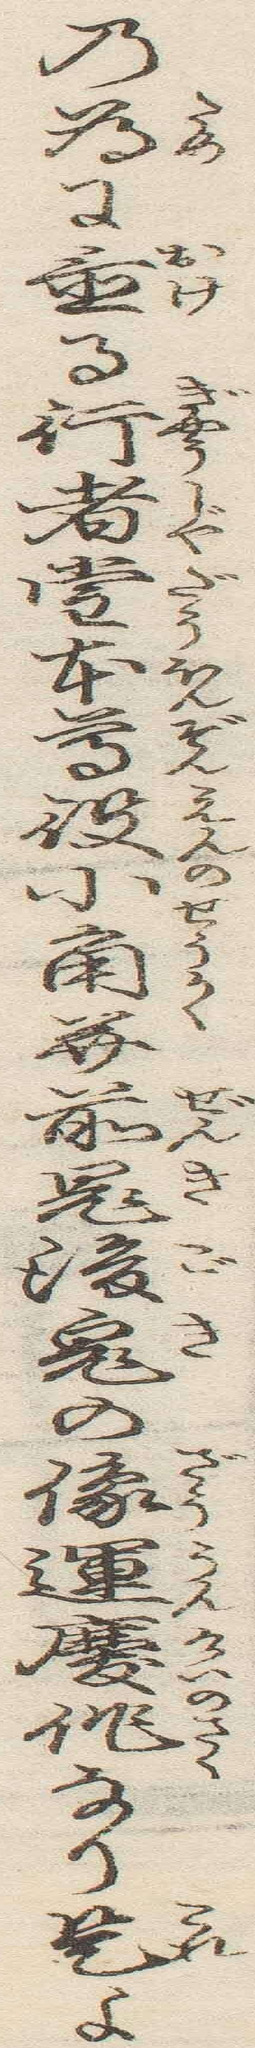の為に置る行者堂本尊役小角并前鬼後鬼の像運慶作なり是よ
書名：日光山志
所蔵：東京学芸大学附属図書館 国文学研究資料館
